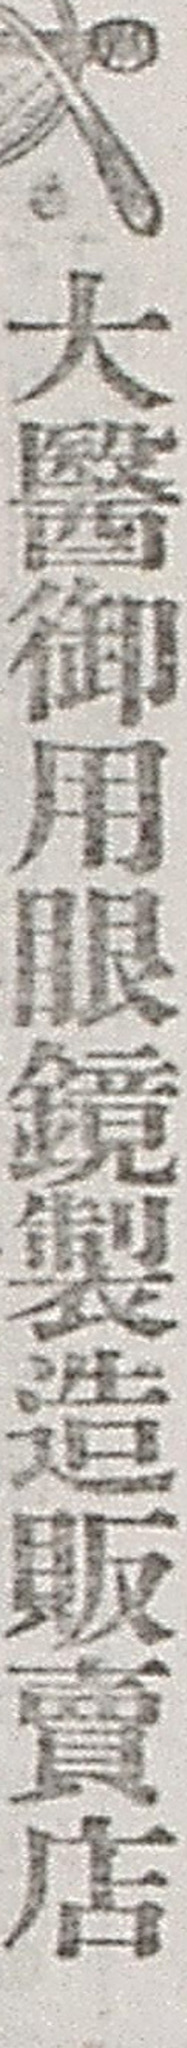大医御用眼鏡製造販売店
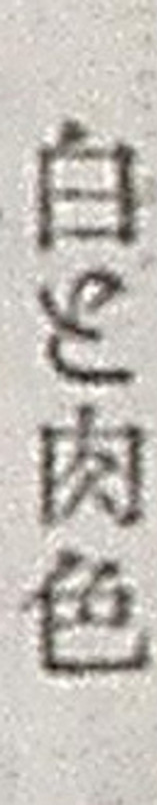白と肉色
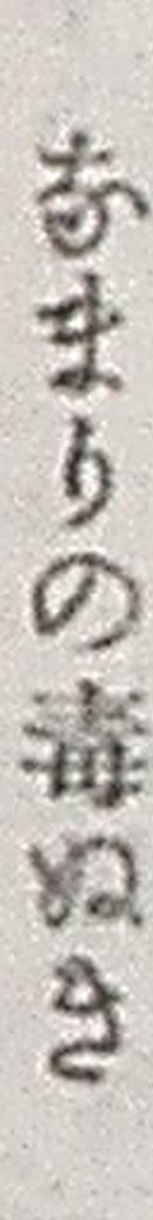なまりの毒ぬき
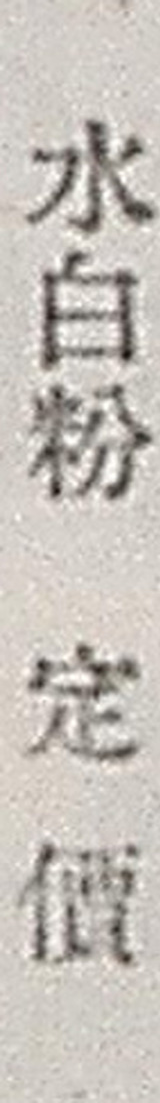水白粉定価
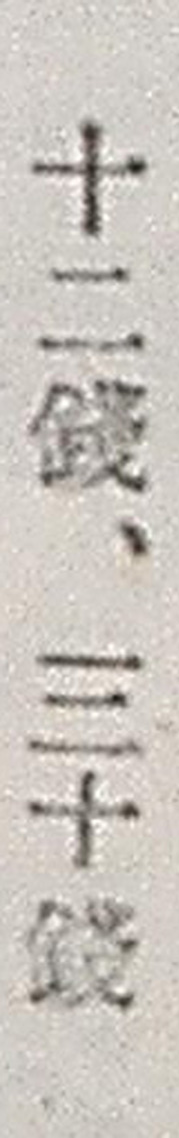十二銭、三十銭
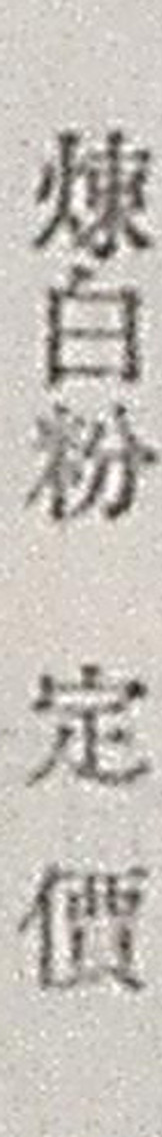煉白粉定価
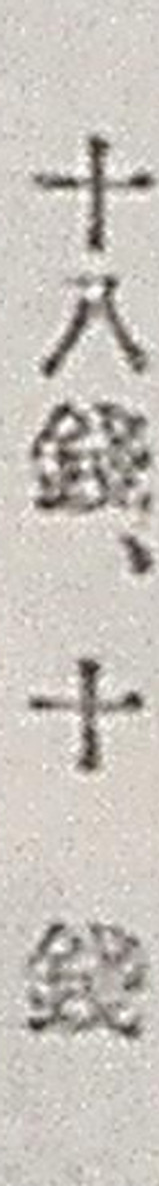十八銭、十銭
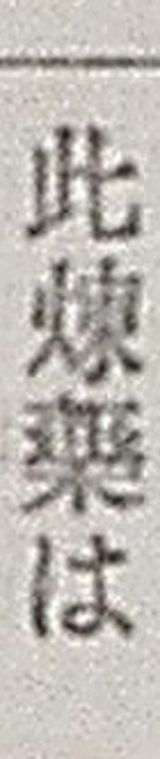此煉薬は
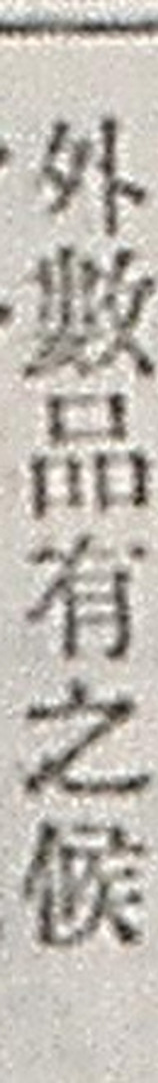外数品有之候
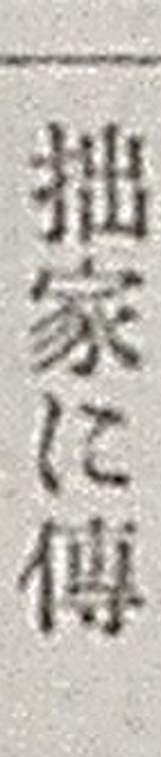拙家に伝
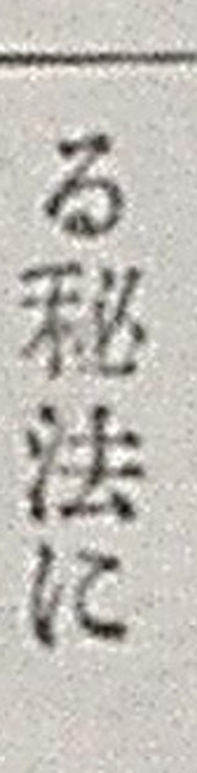る秘宝に
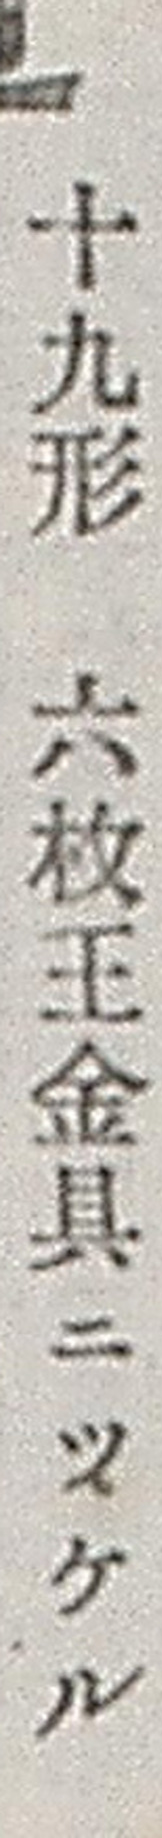十九形六枚王金具ニツケル
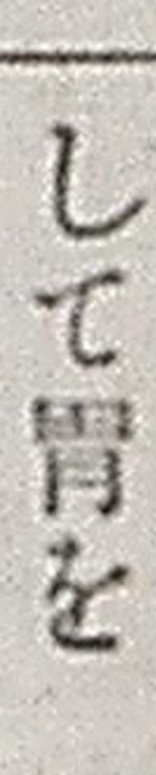して胃を
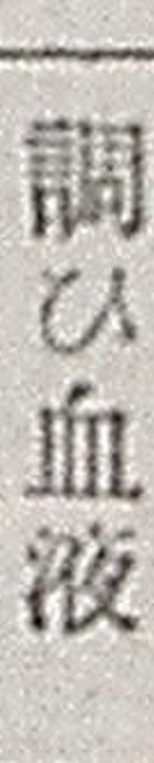調ひ血液
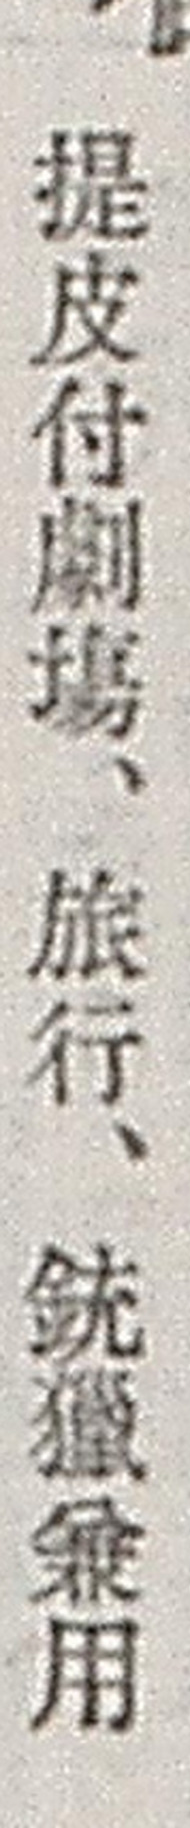提皮付劇場、旅行、銃獵兼用
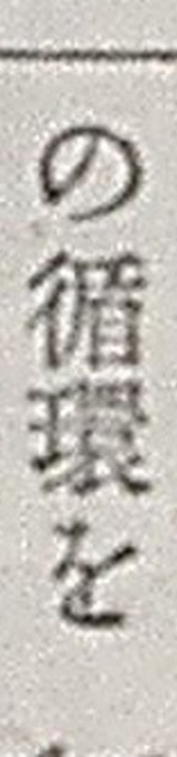の循環を
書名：風俗畫報臨時増刊第百二十號　大海嘯被害録（下）
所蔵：東京大学地震研究所図書室 Earthquake Research Institute Library, The University of Tokyo, JAPAN
